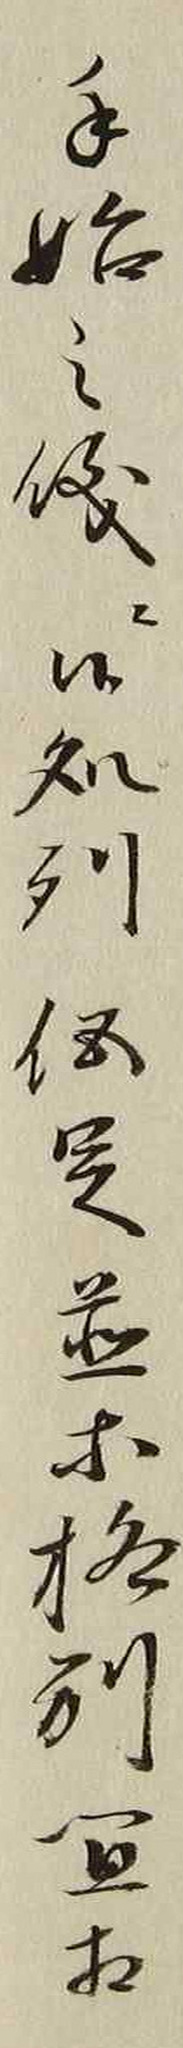手始之儀ニ候処列伍足並等格別宜相
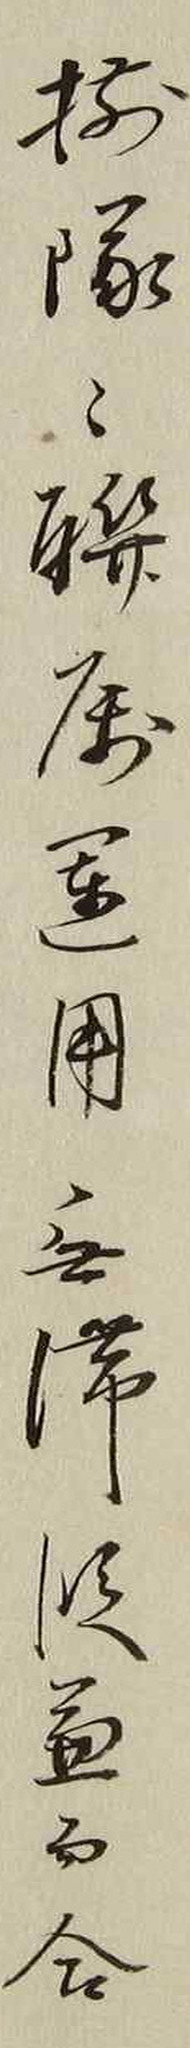揃隊之聯属運用無滞段兼而合
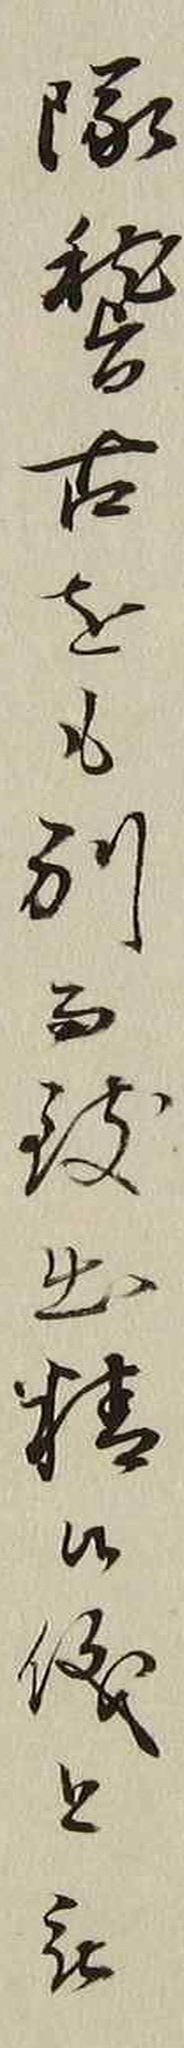隊稽古をも別而致出精候儀と被
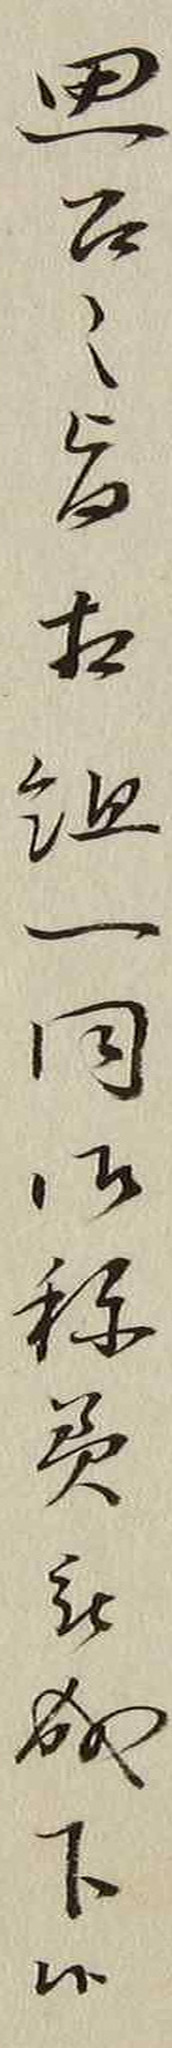思召之旨相組一同御称美被成下候
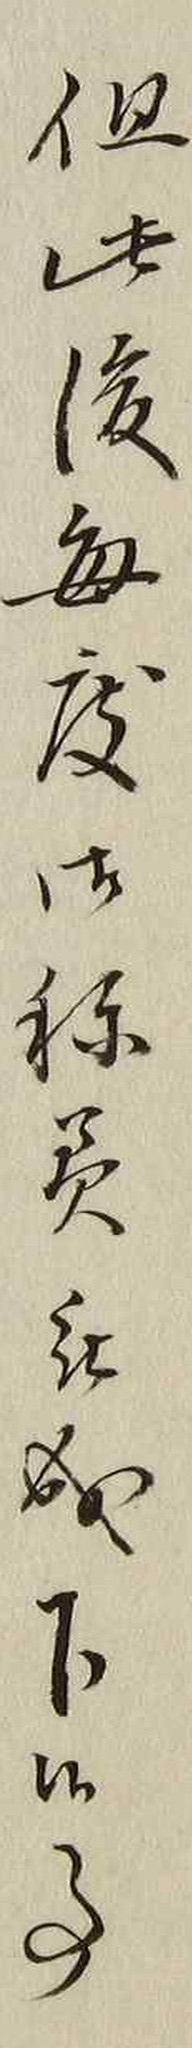但此後毎度御称美被成下候事
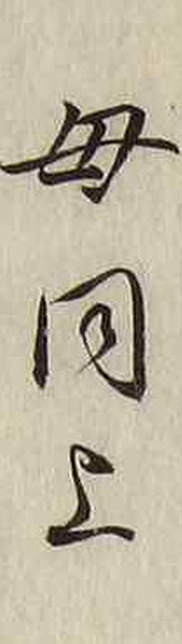母同上
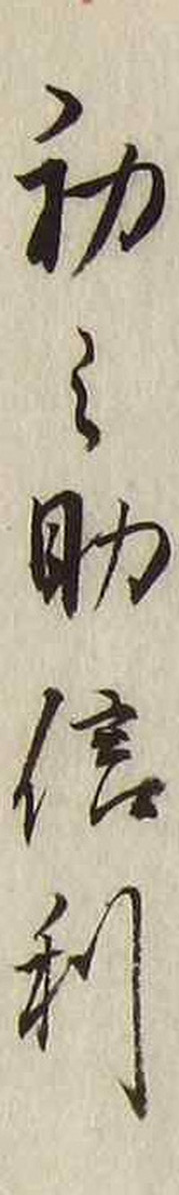初之助信利

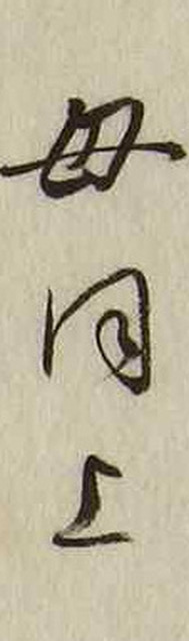母同上
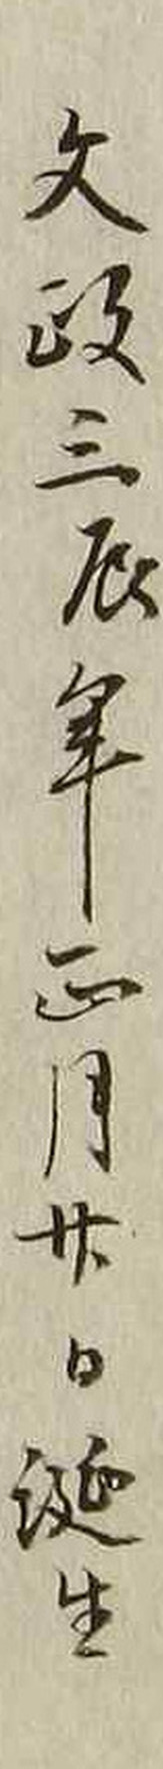文政三辰年正月廿日誕生
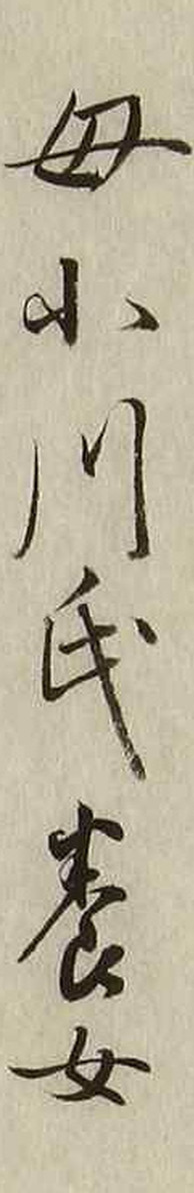母小川氏養女
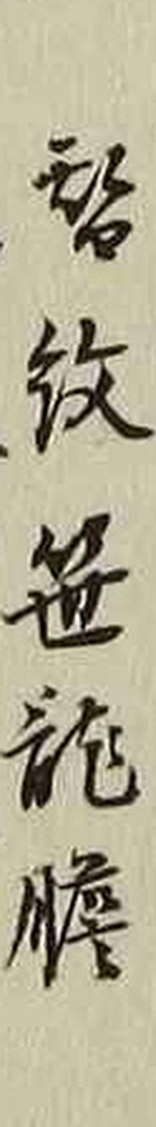替紋笹龍胆
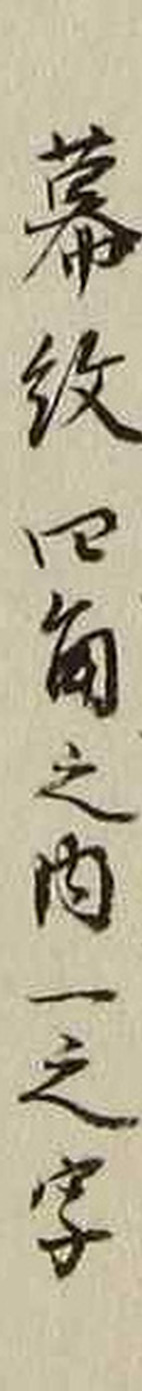幕紋四角之内一之字
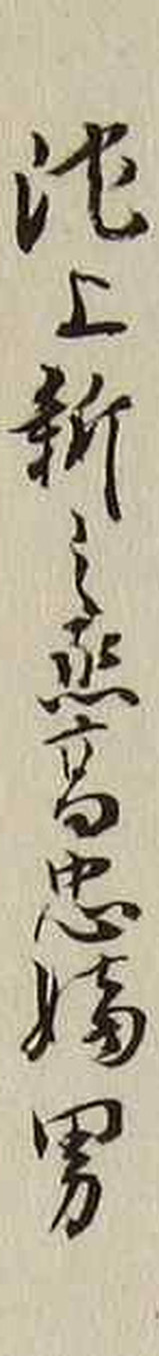池上新之丞高忠嫡男
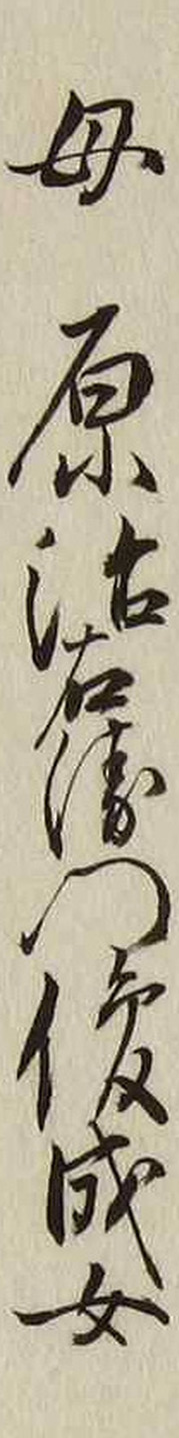母原治右衛門俊成女
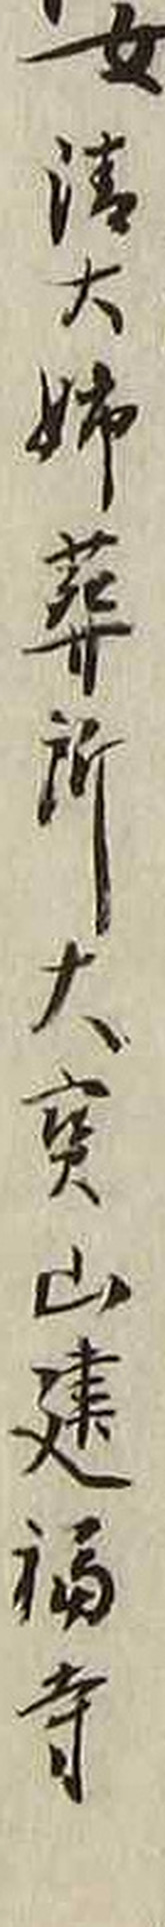清大姉葬所大窪山建福寺
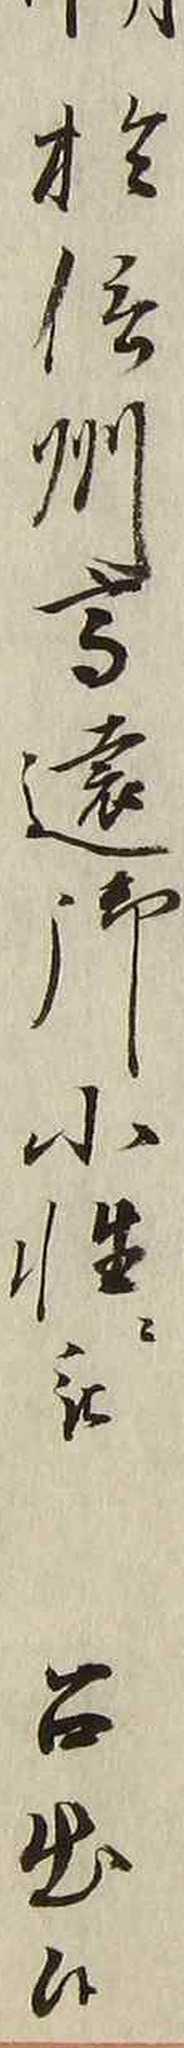不詳於信州高遠御小性ニ被召出候
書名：諸士系譜　巻之22　い之部22
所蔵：会津若松市立会津図書館
